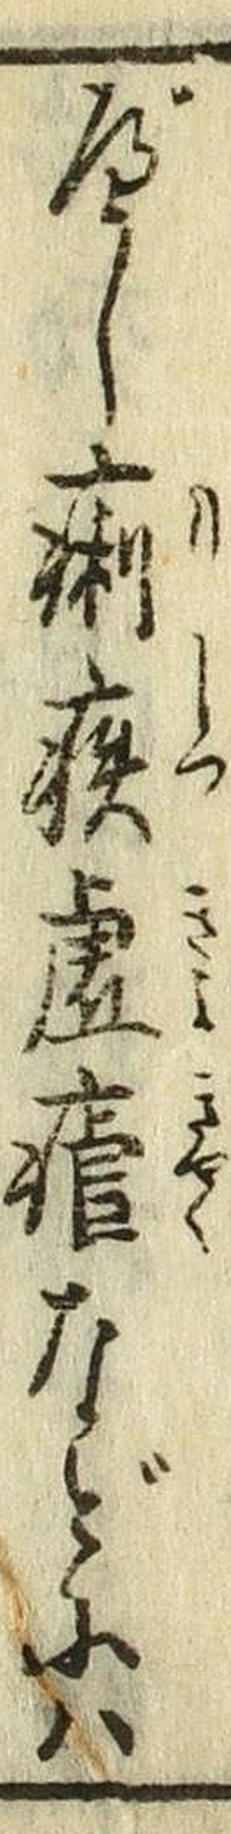べし痢疾虚瘧などには
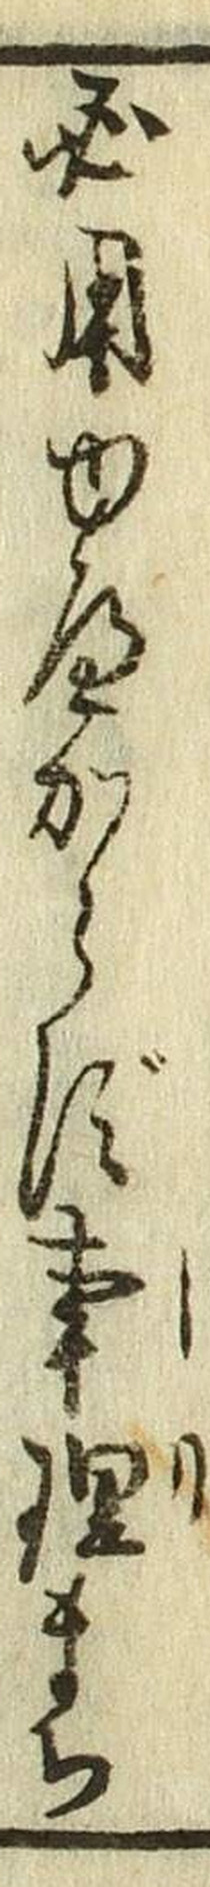必用ゆへからず事理まち
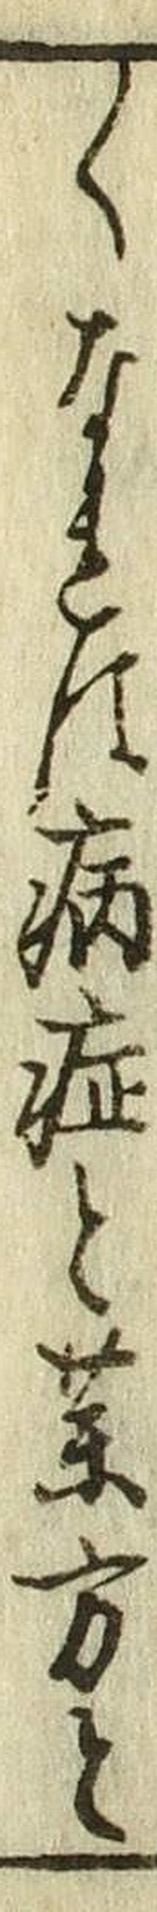〳〵なれは病症と薬方と
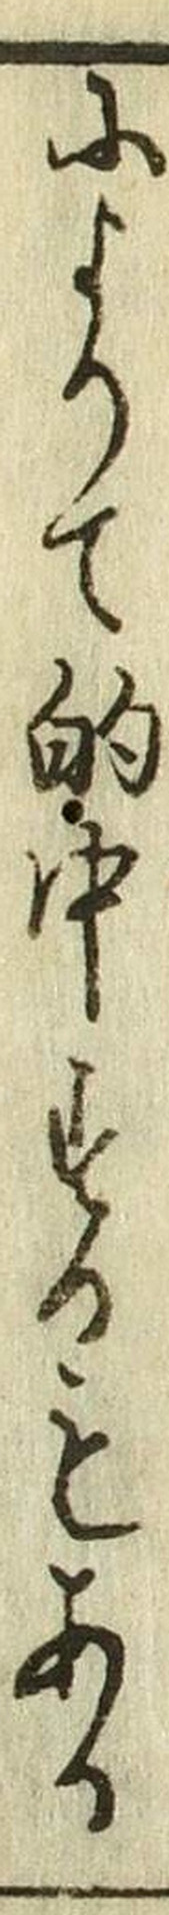によりて的中するもある
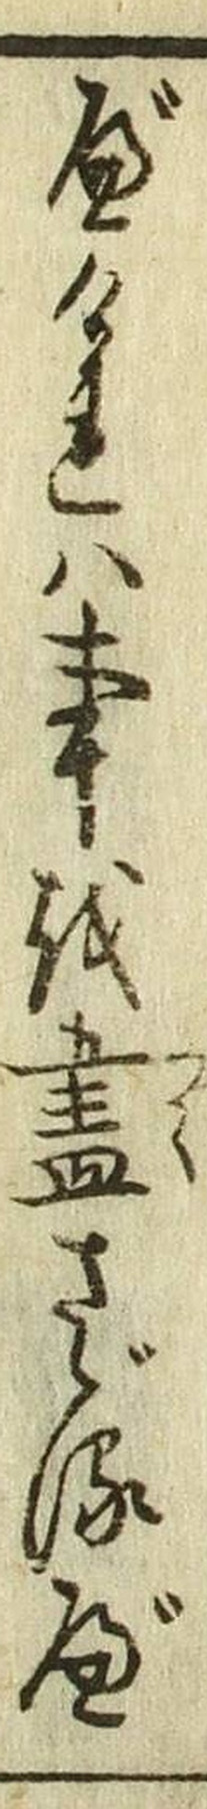べけれは事を尽さゞるべ
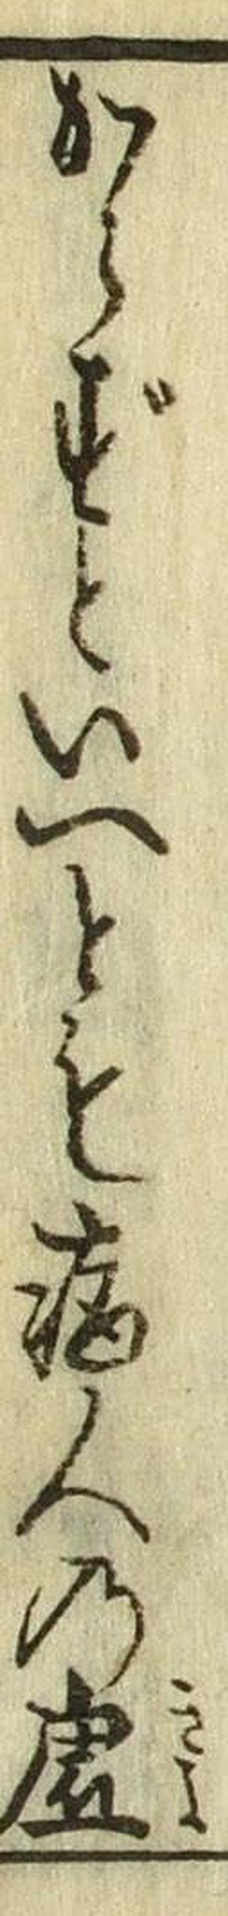からずといへとも病人の虚

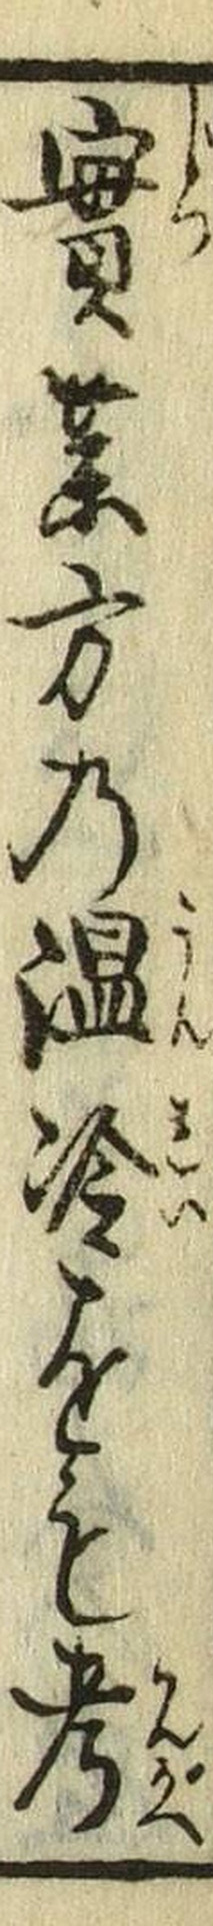実薬方の温冷をも考
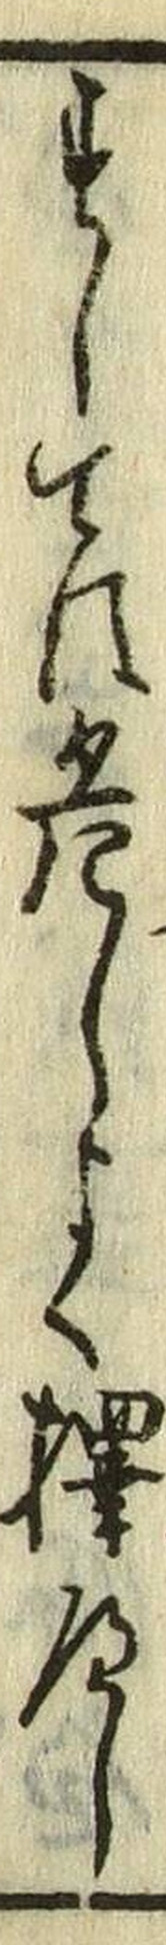すしては危しよく択へし
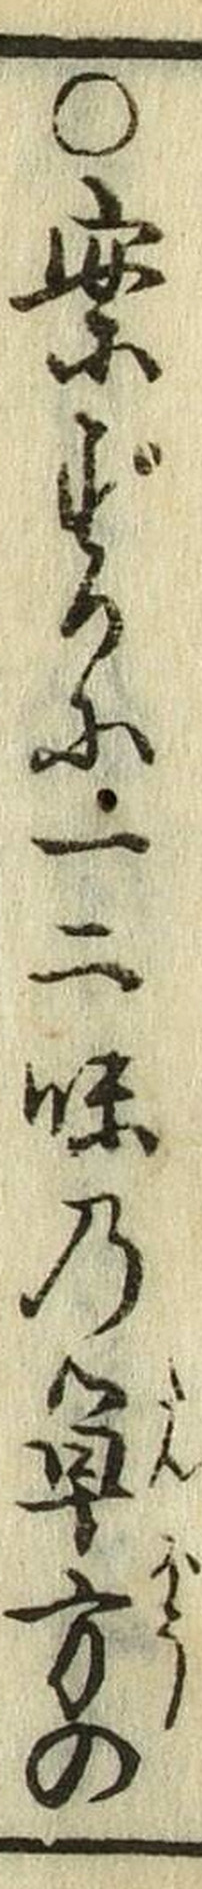◯案ずるに一二味の単方の
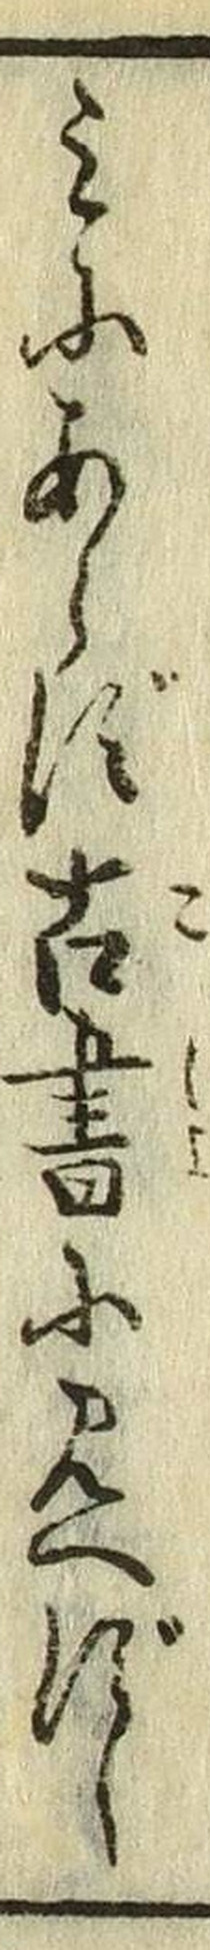みにあらず古書に見へずし
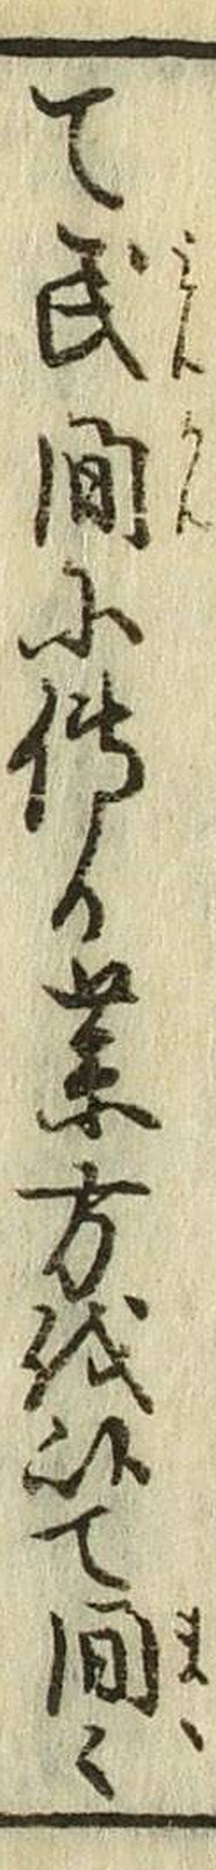て民間に伝る薬方を以て間々
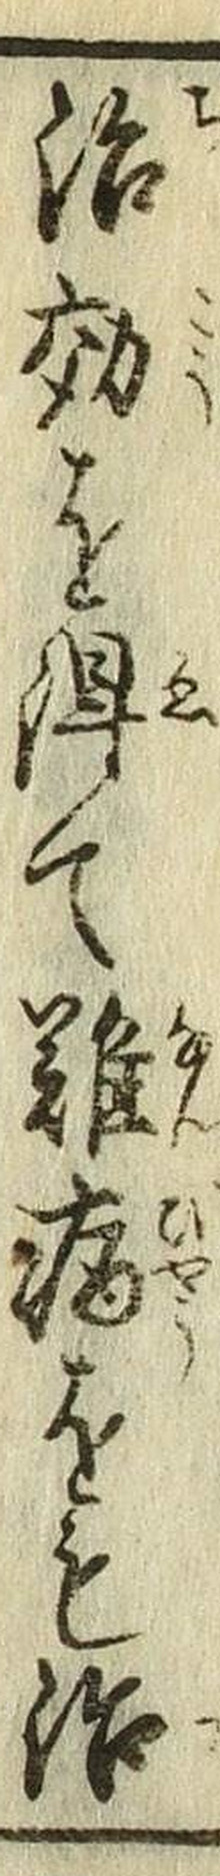治効を得て難病をも治
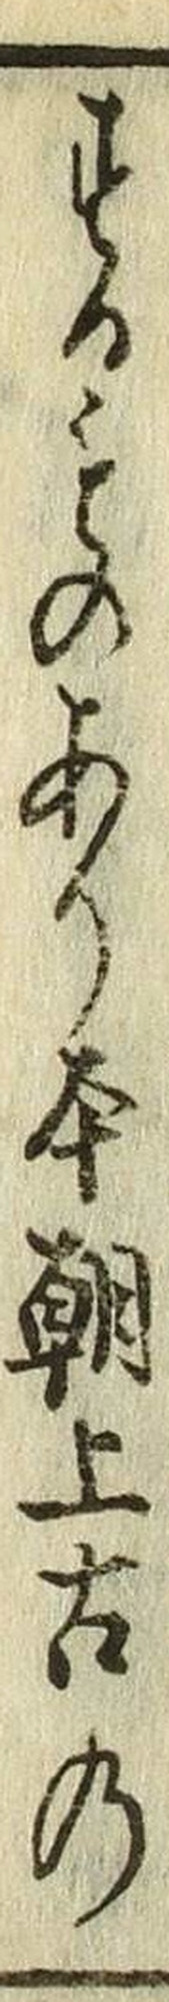するものあり本朝上古の
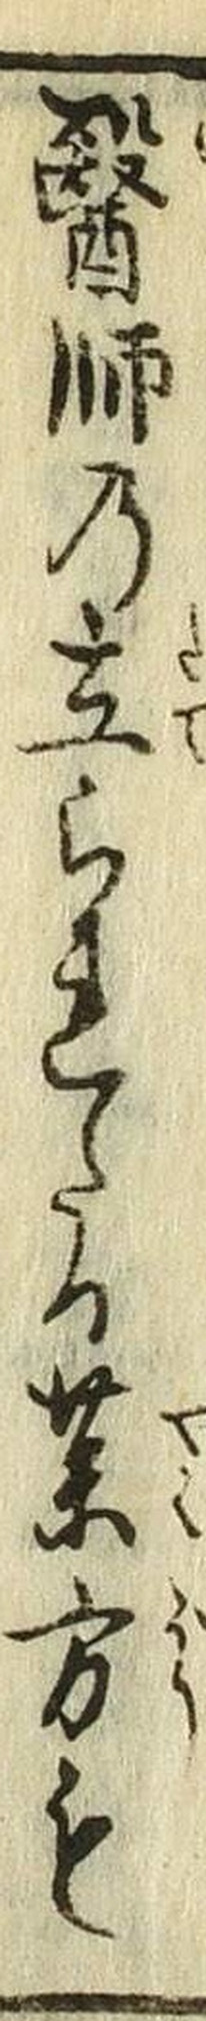医師の立られたる薬方も
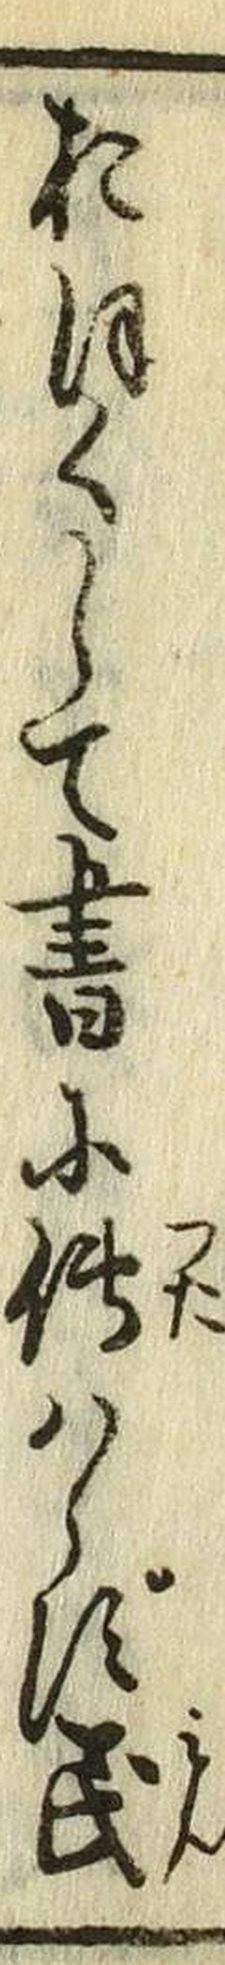おほくして書に伝はらず民
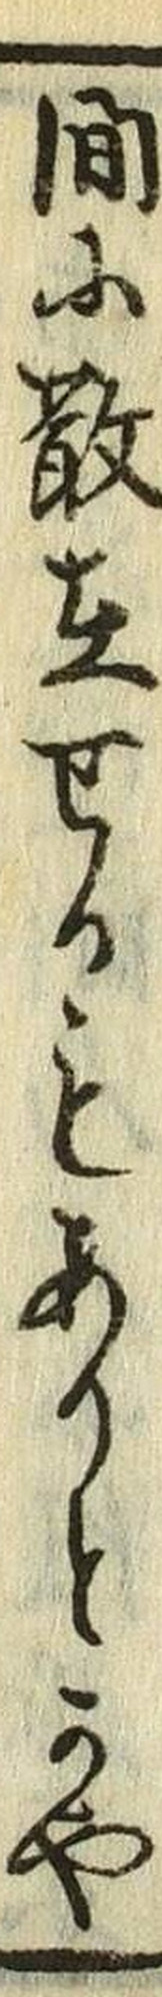間に散在せるもありとかや
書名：居家養生記
